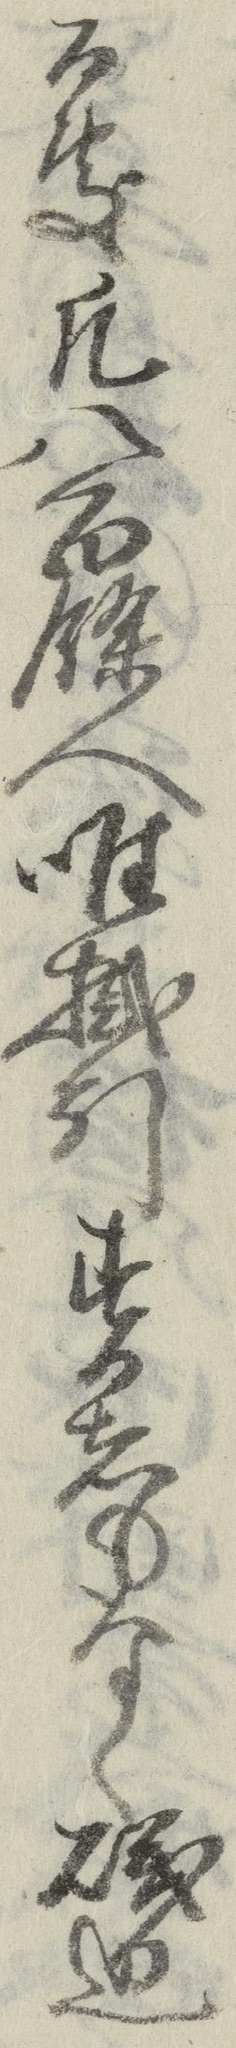る処凡八百餘人唯掛引する者もなく磯辺
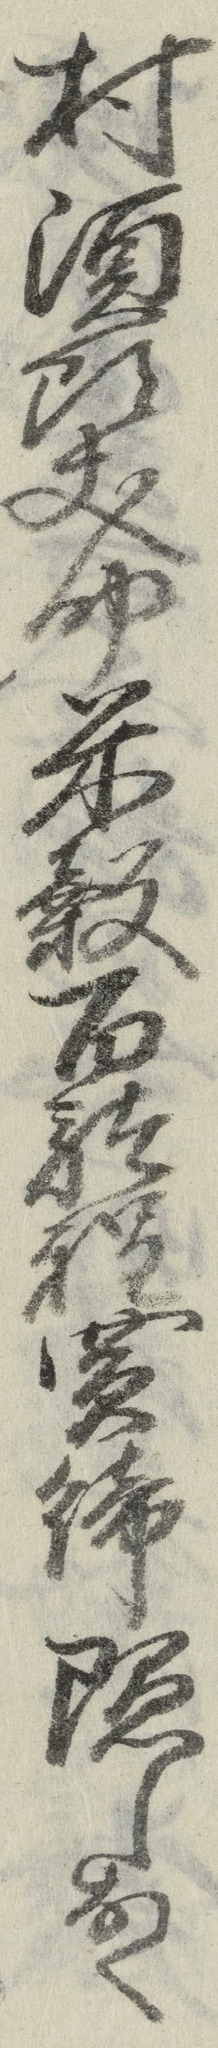村須頭丈助米穀百積程買締隠しおく
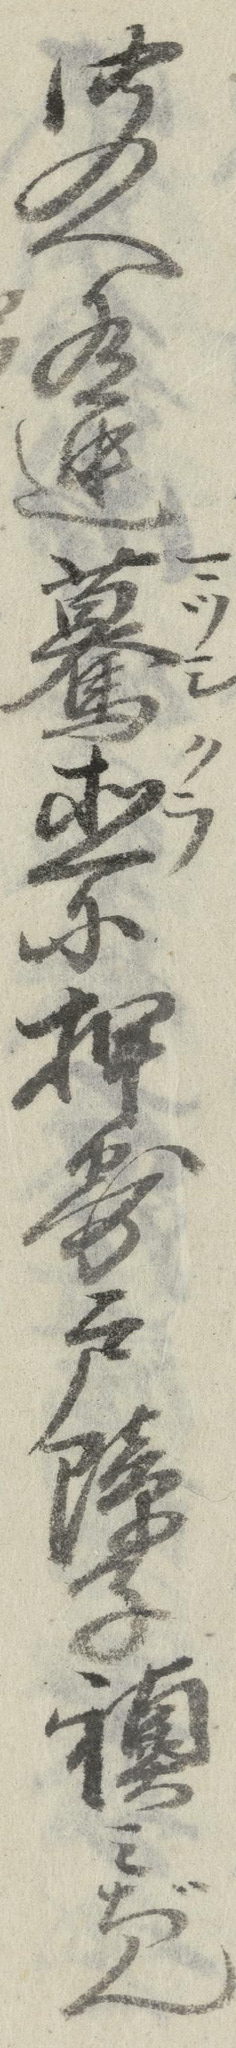聞へ有迚驀直に押寄戸障子襖みぢん
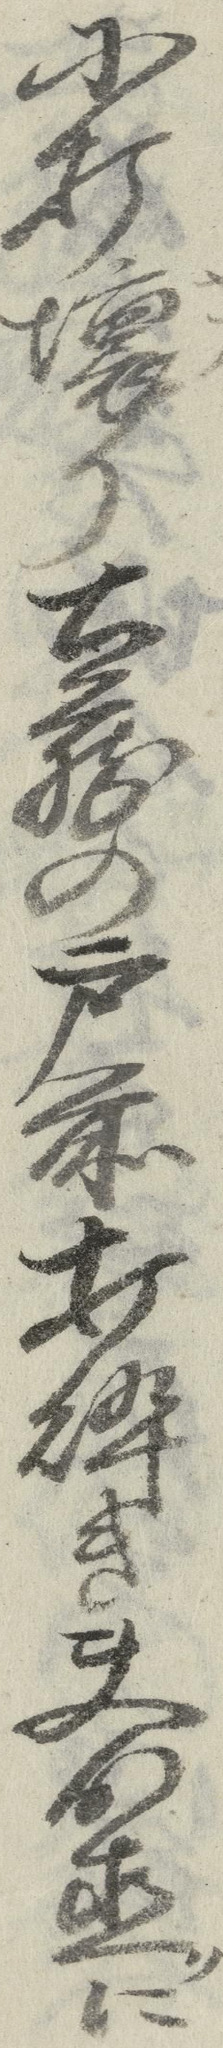に打壞り土蔵の戸前打砕き夫ゟ直
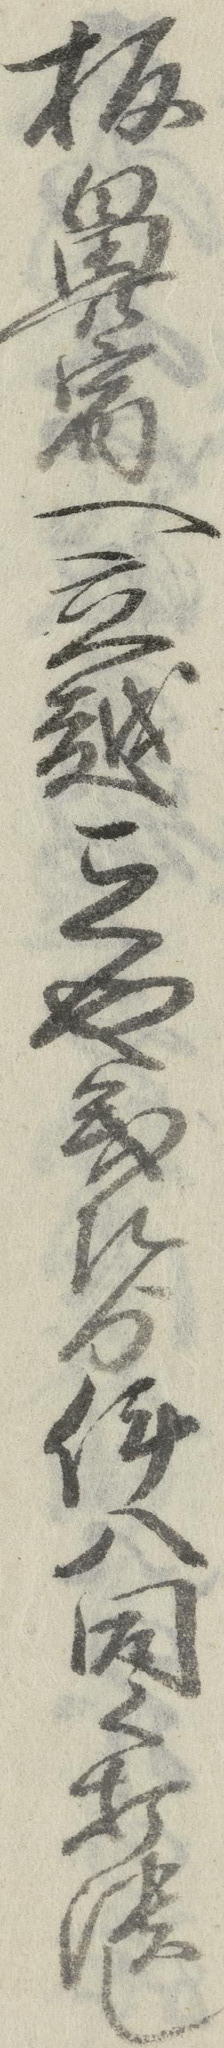板鼻宿へ立越こくや義にゟ伊八同く打潰し
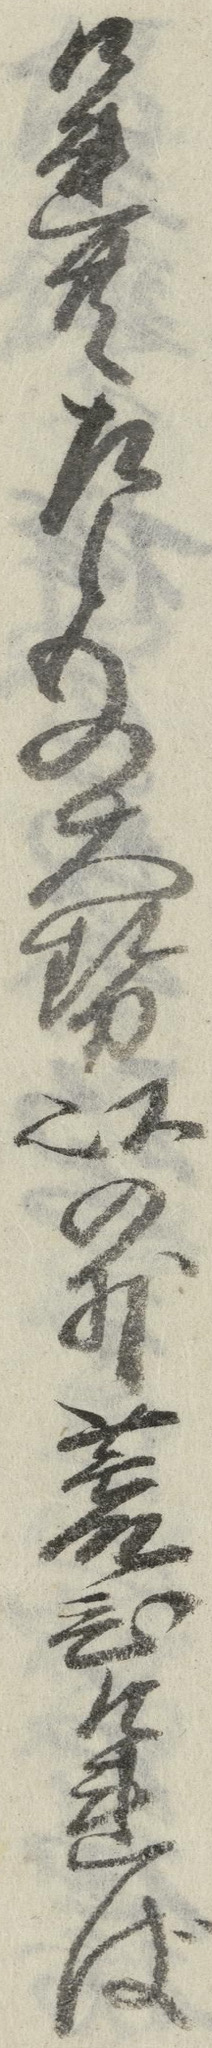けれ共さしもの大勢以の外荒ひければ
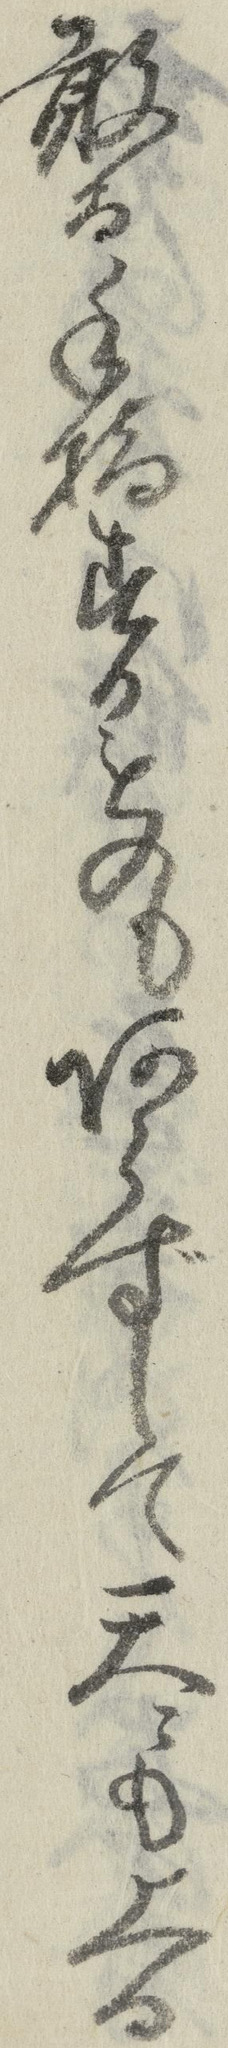散る手指するものもあらずして天にも上る

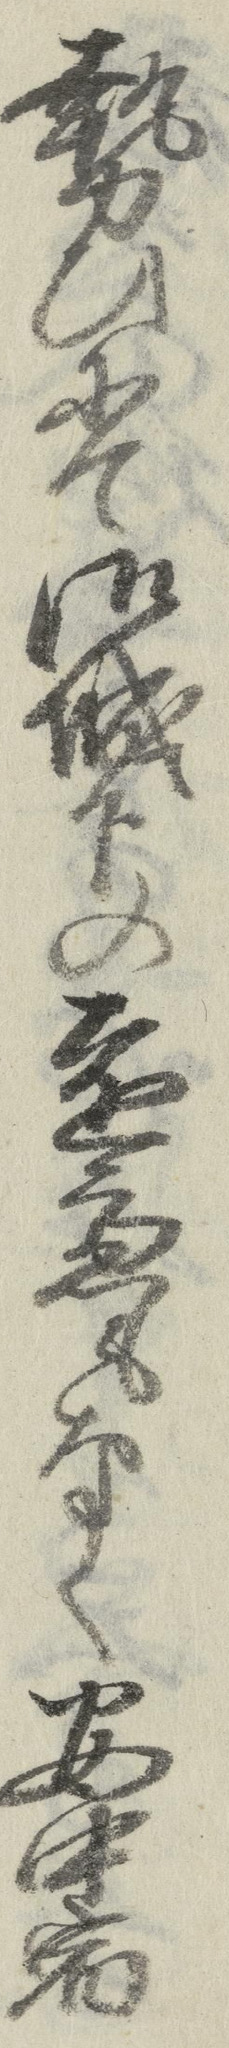勢ひにて御城下の遠慮もなく安中宿
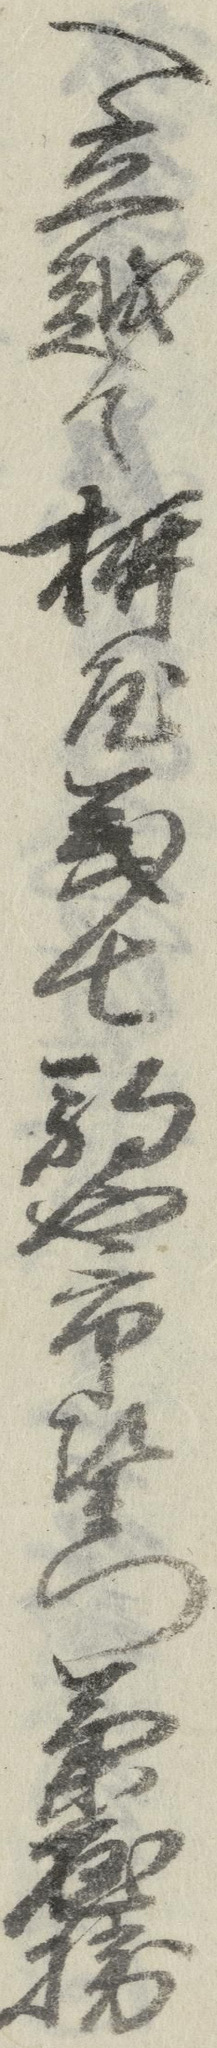へ立越て柳屋義七駒や市左衛門菊屋勝
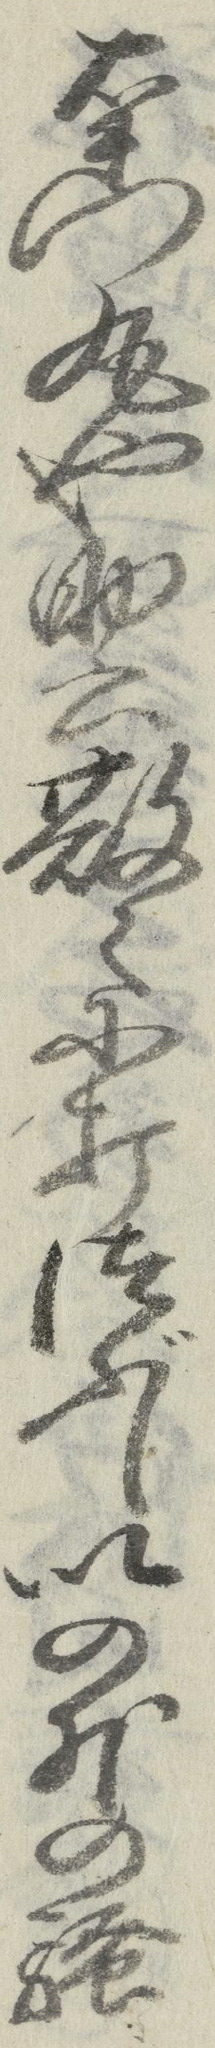右衛門丸や助六散々に打つぶし以の外の騒
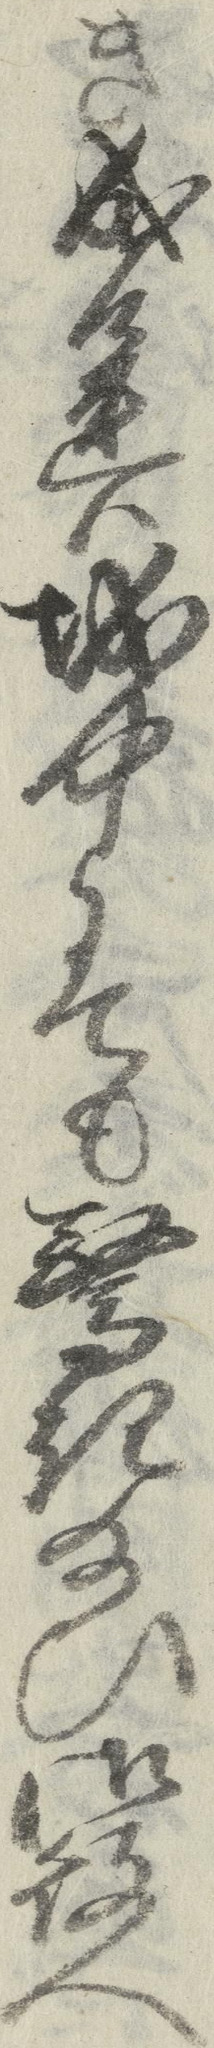き成けれは城中にても驚き給ひ御役人
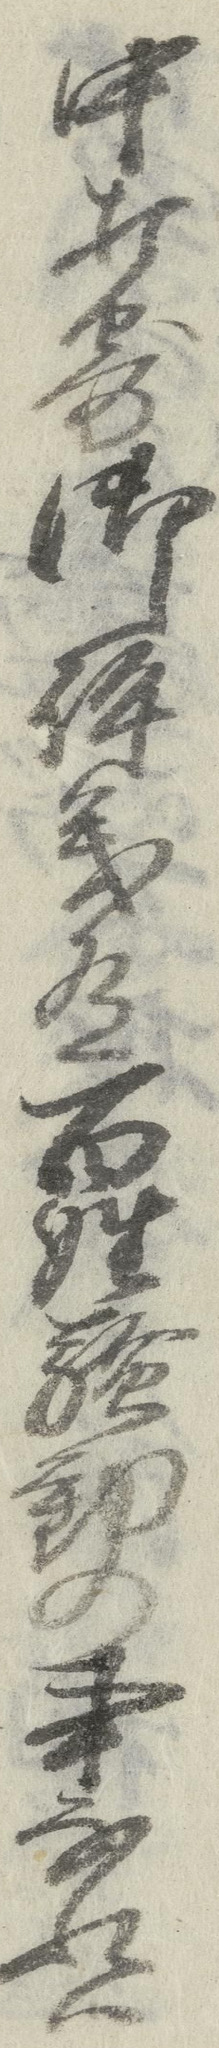中打寄御評義有百姓騒動の事なれは
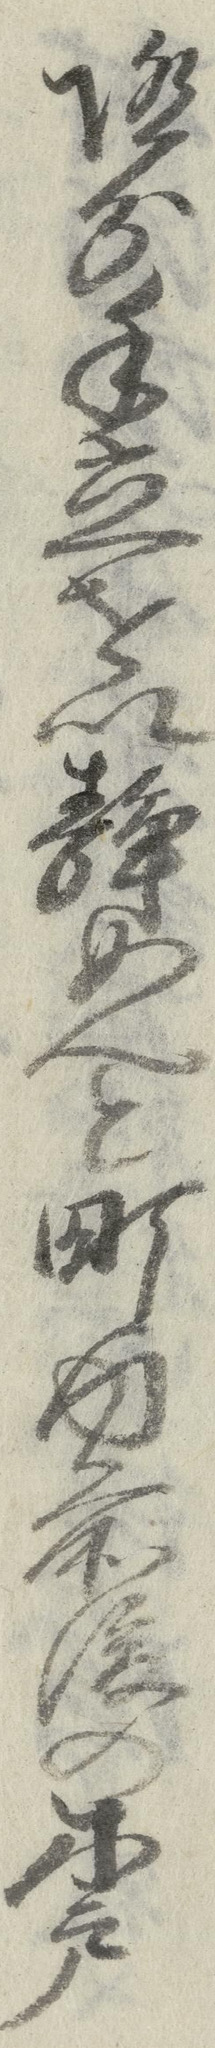随分手立を以て静めんと町内前後の木戸
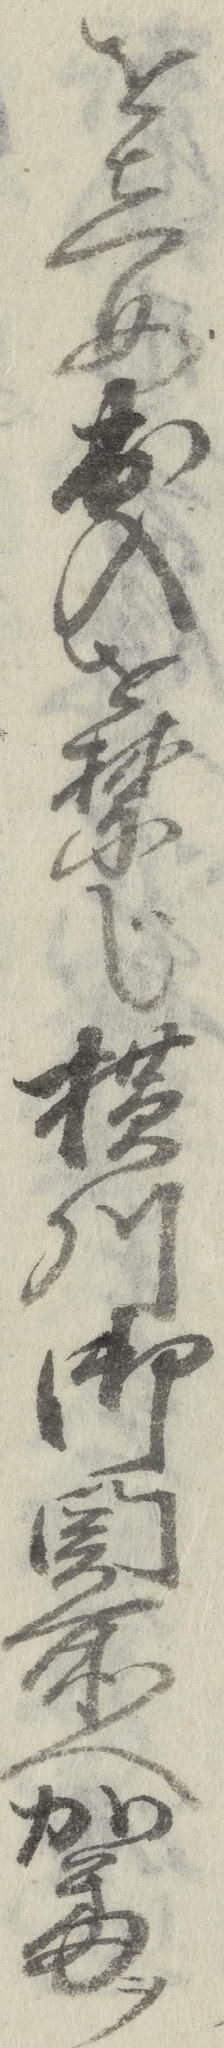をしめ出入を禁じ横川御関所へ加番
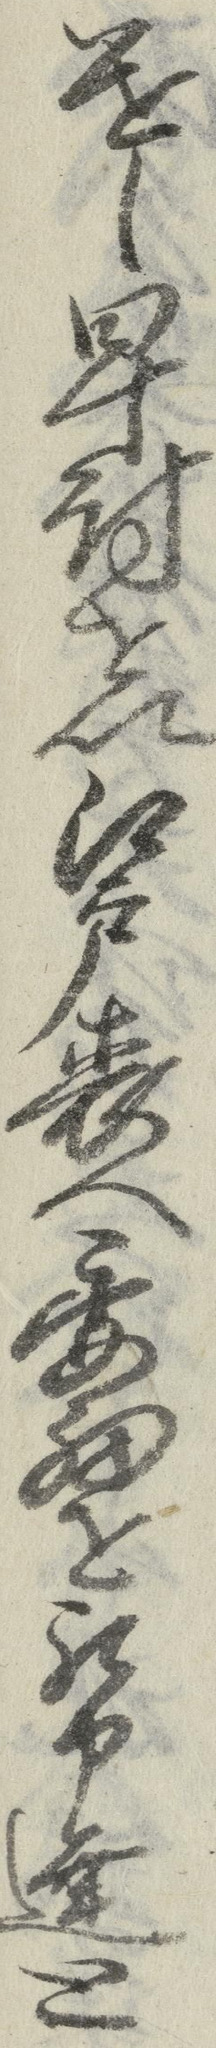遣し早討を以江戸表へ委細を被申逢と
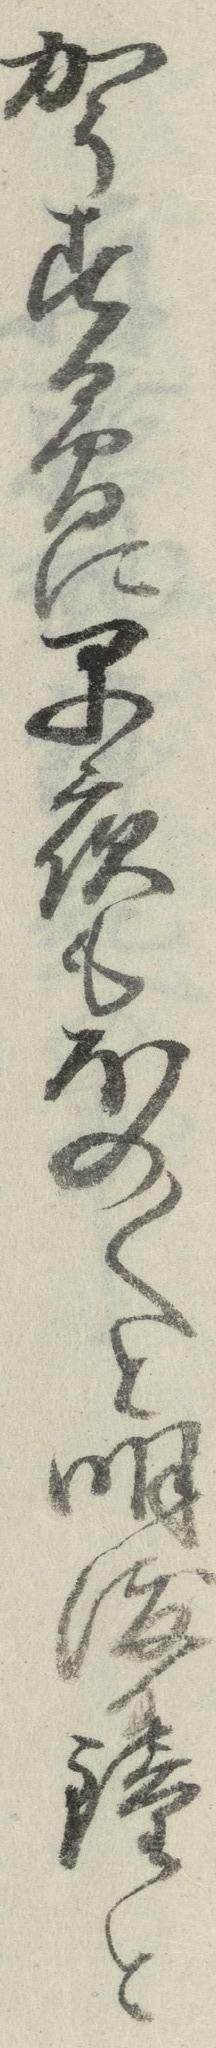かうする間に早夜もほの〳〵と明渡り鐘と
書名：浅間大焼騒動記　中
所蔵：東京大学地震研究所図書室 Earthquake Research Institute Library, The University of Tokyo, JAPAN
